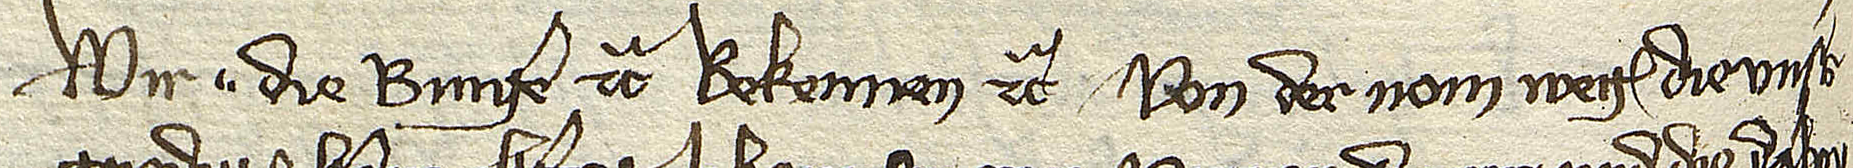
Wir ~ die Burge* ec* Bekennen ec* / Von der nom weg* die vnſ*s
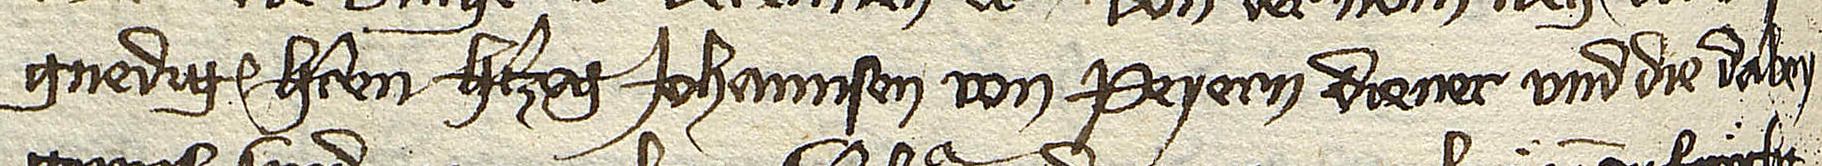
gnedig* h*ren hcʒog* Iohannſen von Peyern diener vnd die dabey
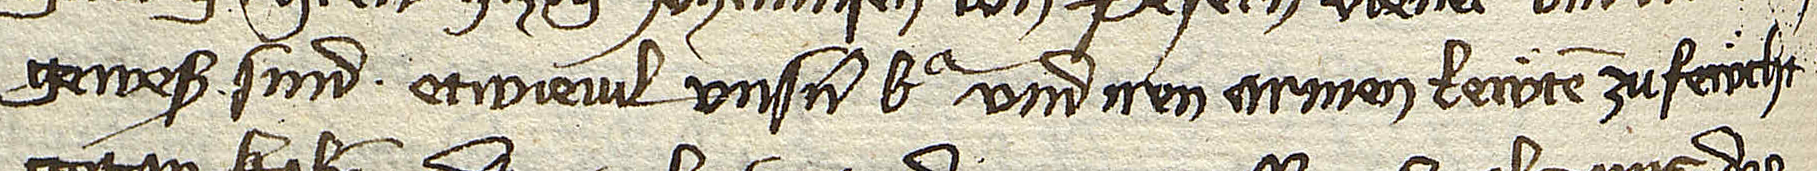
geweſ* ſind . etwieuil vnſ*n b* vnd iren armen lewte* ʒu fewcht
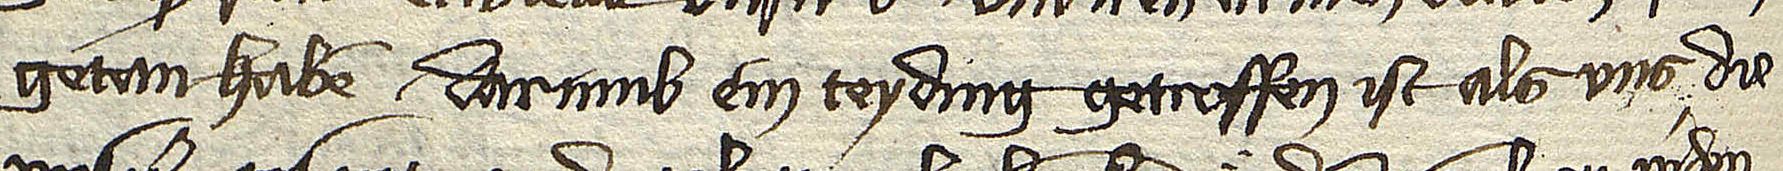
getan habe* / Darumb ein teyding getroffen iſt als vns die
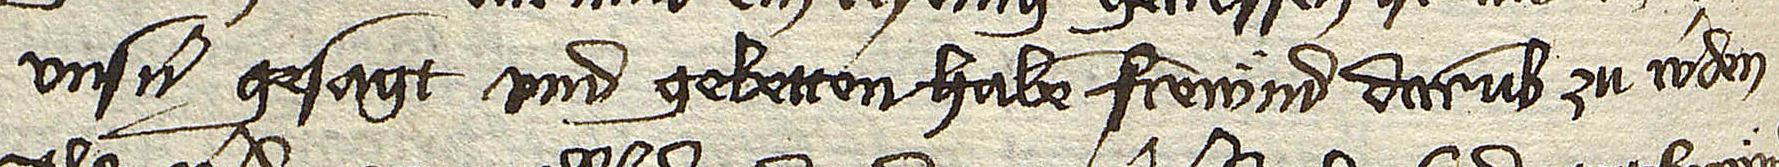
vnſ*n geſagt vnd gebetten habe* frewnd darub* ʒu w*den
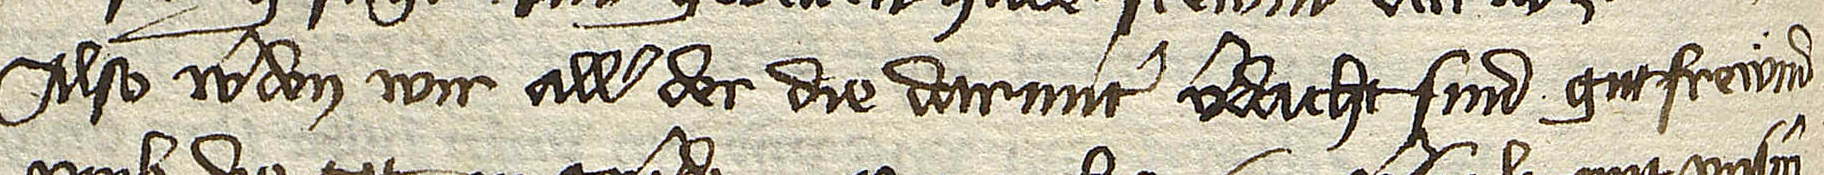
Alſo w*den wir all* der die darunt* v*dacht ſind gut frewnd
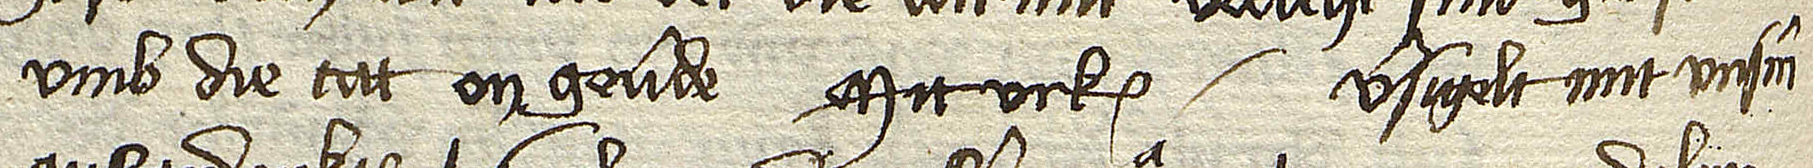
vmb die tat on geu*de Mit vrk* / v*ſigelt mit vnſ*m
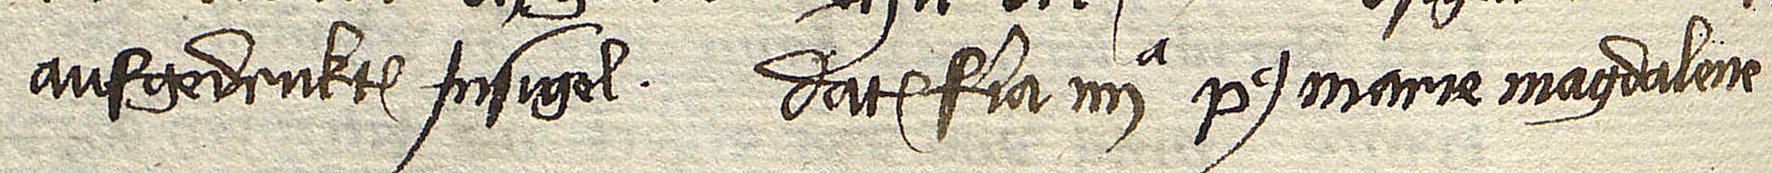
aufgedrukt* Inſigel . dat* fia* iiii* p* marie magdalene
